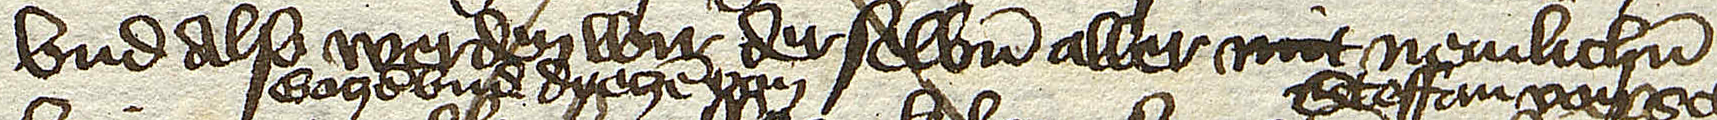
vnd Alſo werden wir derſelb*n aller mit nemlich*n
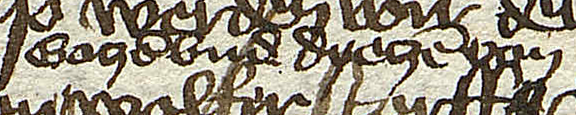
Gocʒe* vnd dyecʒe* von
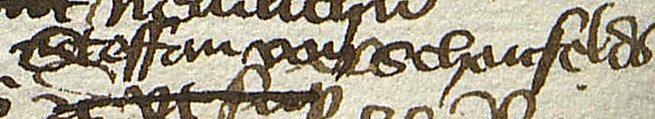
Steffan von Schonfelds
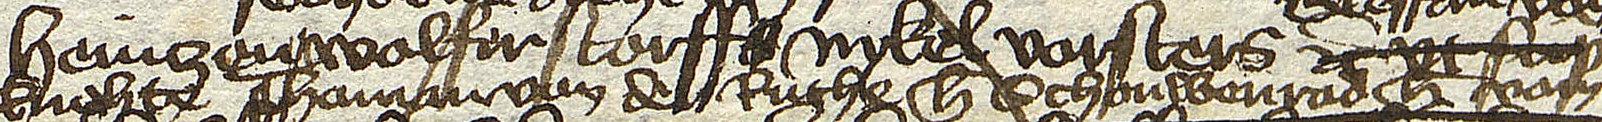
Heincʒen wolferſtorffs Nykel vorſters ec* vt ſup*
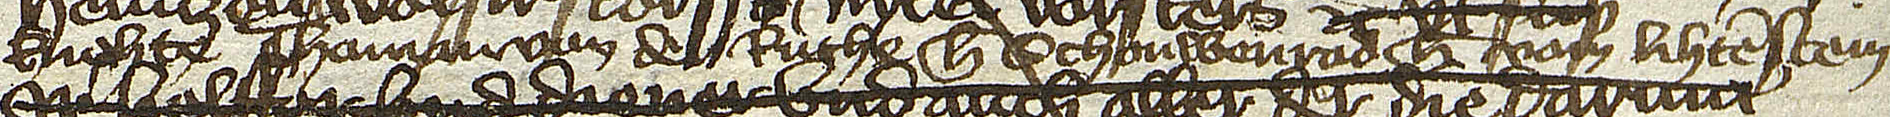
knehte Thoman von der Ruche H* Schonwenrad h* vom lihte*ſtein
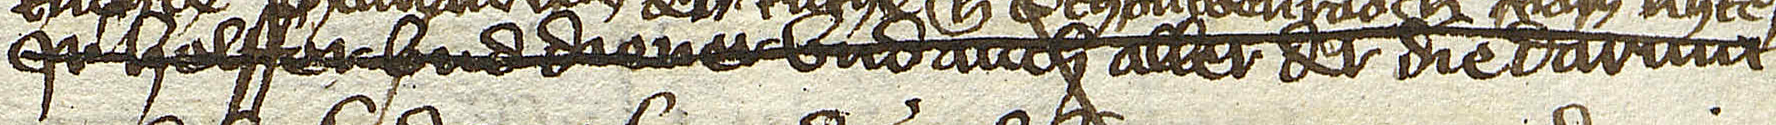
Ir helffer vnd diener vnd auch aller der die darunt*
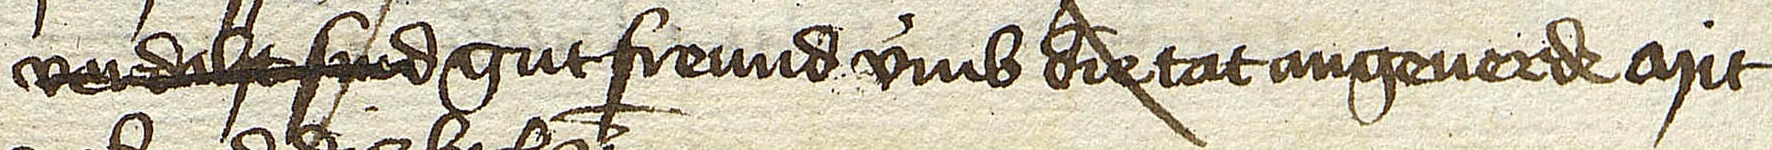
verdaht ſind gut freund v̈mb die tat ongeuerde Mit
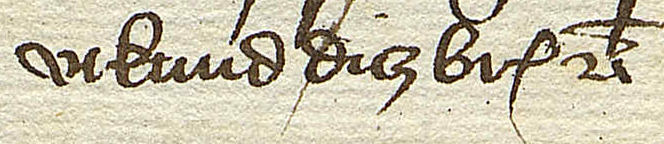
vrkund dicʒ br* ec*
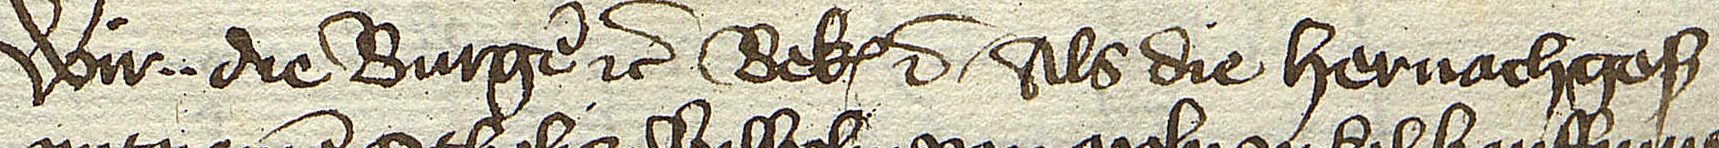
Wir ~ die Burge* ec* Bek* ec* / Als die hernach geſ*
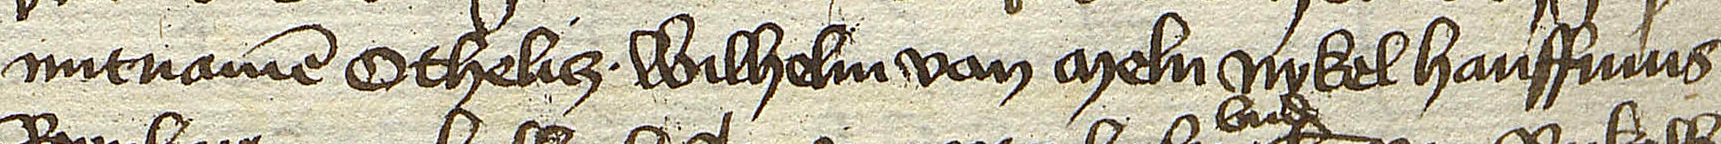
mitname* Othelicʒ . Wilhelm von Meln Nykel hauſfums
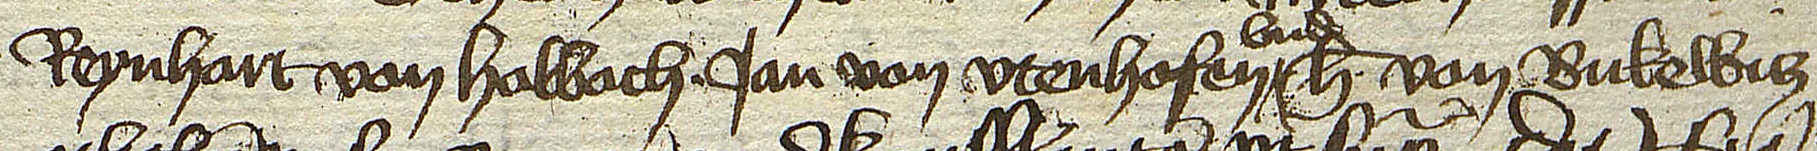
Reynhart von Halbach . Ian von vtenhofen H* von Bukewicʒ
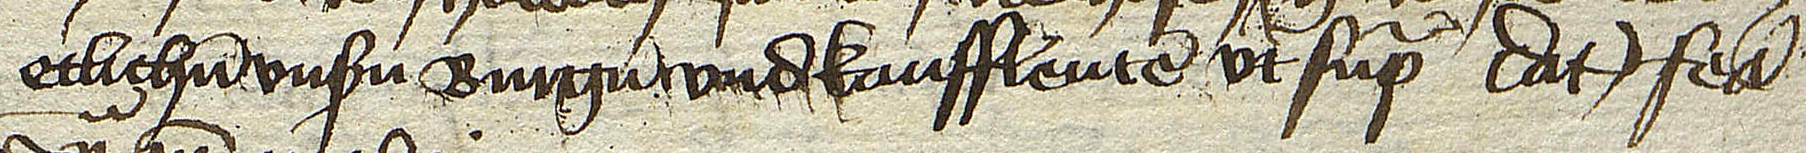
etlich*n vnſ*n Burg*n vnd kauffleute* vt ſup* Dat* fea*
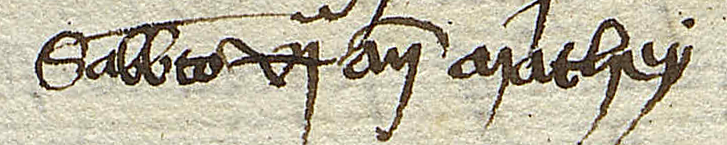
Sabbto* vi an* Mathey
